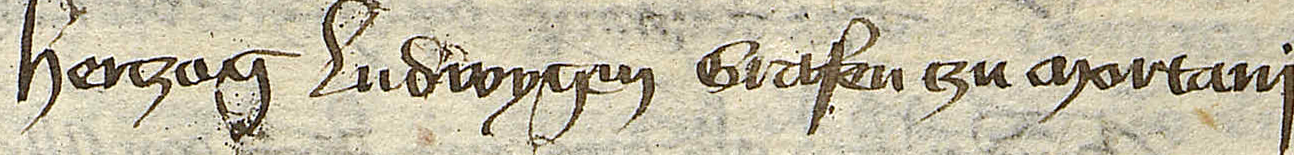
Hercʒog Ludwygen Grafen cʒu Mortani
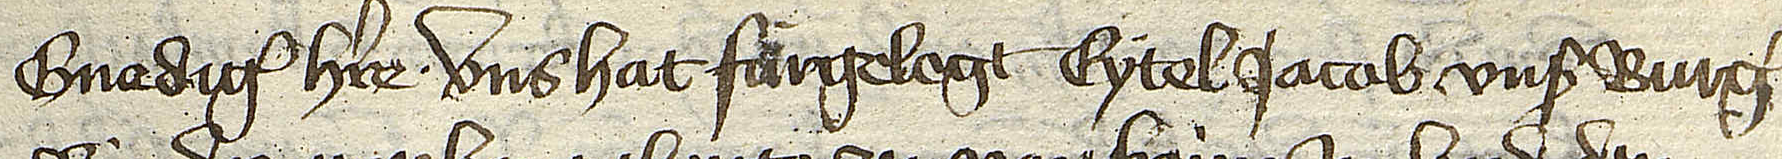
Gnedig* h*re . Vns hat fürgelegt Eytel Iacob vnſ* Burg*
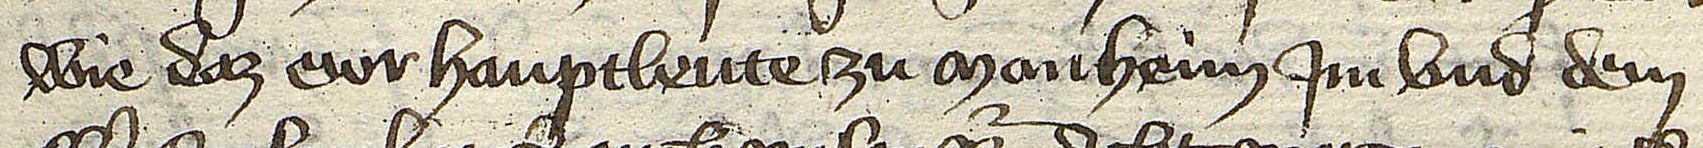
wie daʒ ewr hauptleute cʒu Manheim Im vnd dem
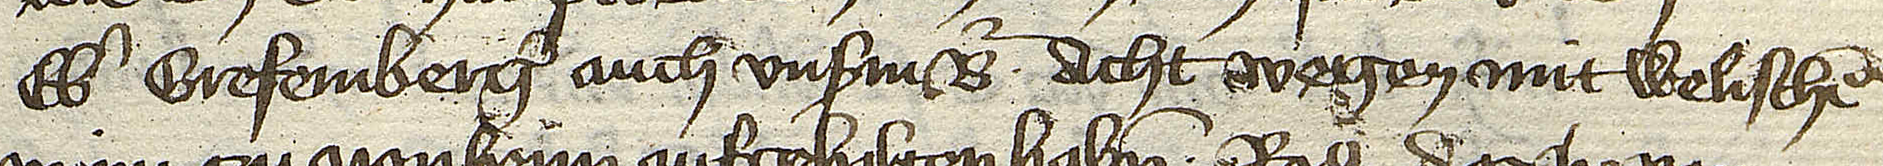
Eb* Grefemberg* auch vnſ*m B* . Acht wegen mit weliſche*
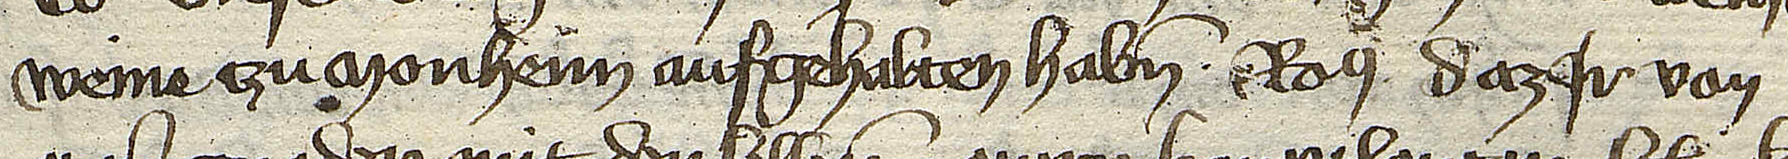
weine cʒu Monheim aufgehalten habn* . Ro* daʒ Ir von
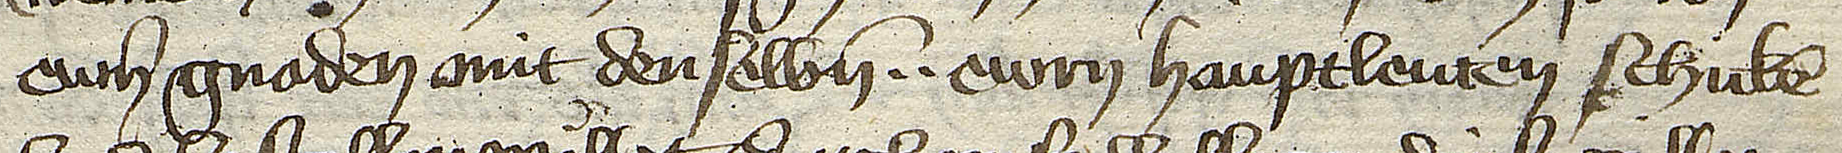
ew*n gnaden mit denſelbn* ~ ewrn hauptleuten ſchicke*
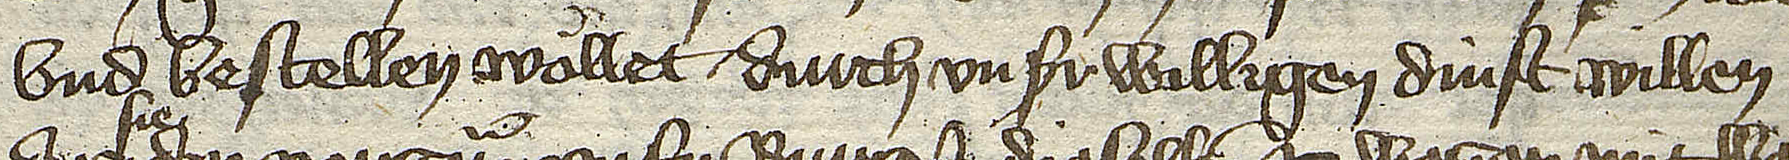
vnd beſtellen wöllet / durch vnſ*r willigen dinſt willen
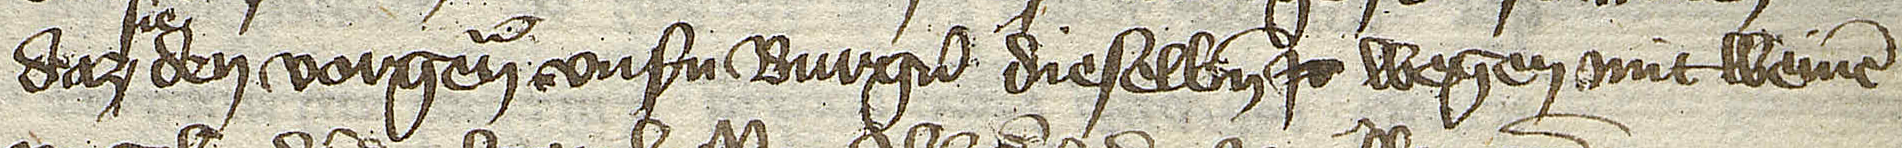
daʒ den vorgen* vnſ*n Burgn* dieſelbn* Ir wegen mit weine*
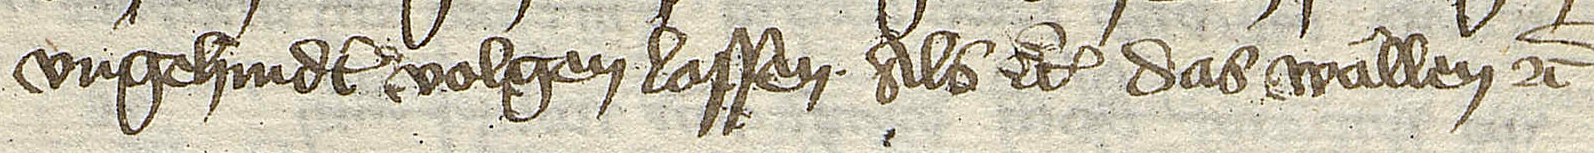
vngehind*t volgen laſſen . Als ec* Das wöllen ec*
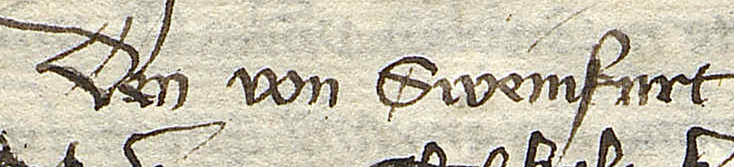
Den von Sweinfurt
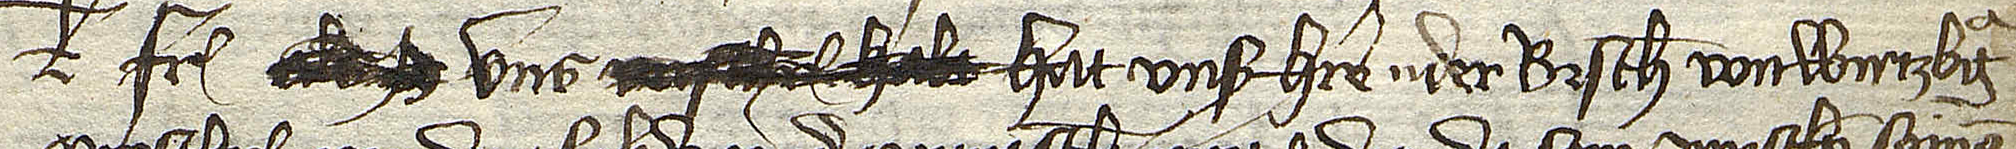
L* Fr* als Ir Vns verſchr* habt hat vnſ* h*re ~ der Biſch* von Wircʒb*g
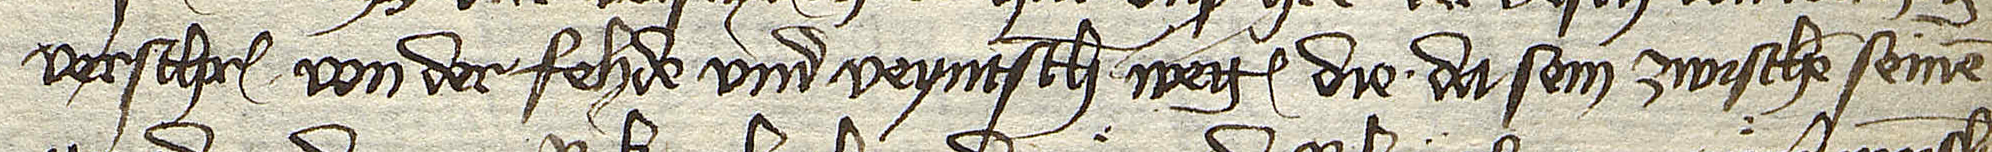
verſchr* / von der fehde vnd veyntſch* weg* die . da ſein ʒwiſche* ſeine*
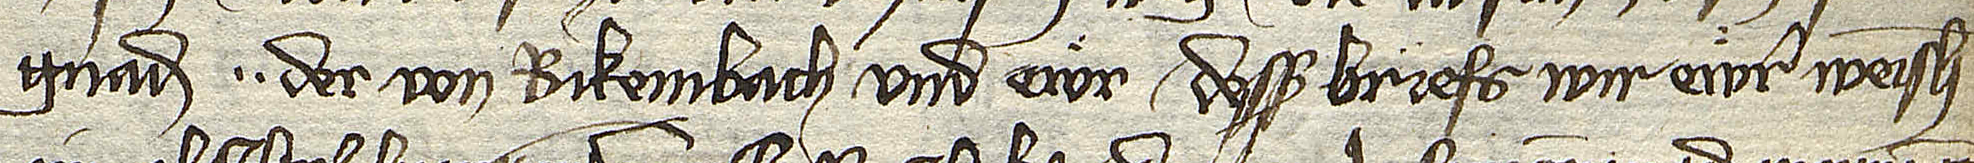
gnad* ~ der von Bikembach vnd eẅr / Deſſ* briefs wir eẅr* weiſh*
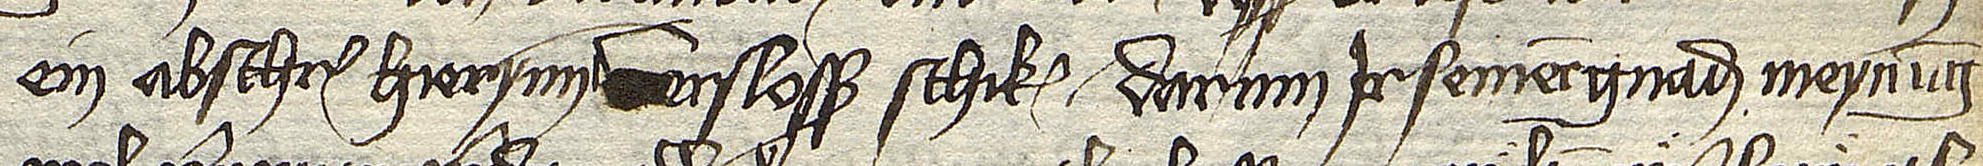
ein abſchr* hierynn* verſloſſ* ſchik* / Darinn Ir ſeiner* gnad* meynu*g
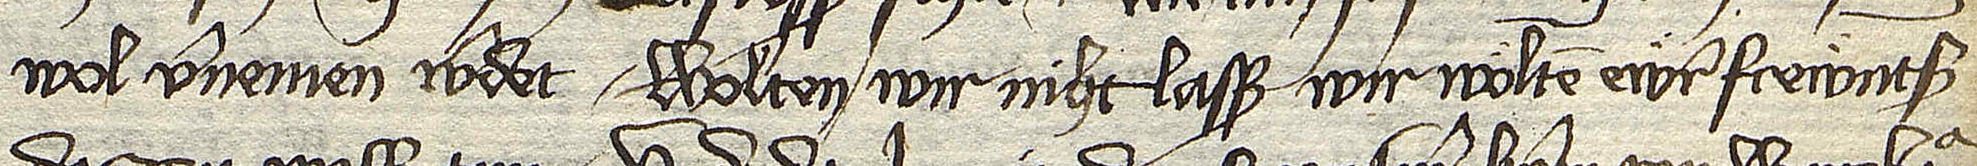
wol v*nemen w*det / Wolten wir niht laſſ* wir wölte* eẅr* freẅntſ*
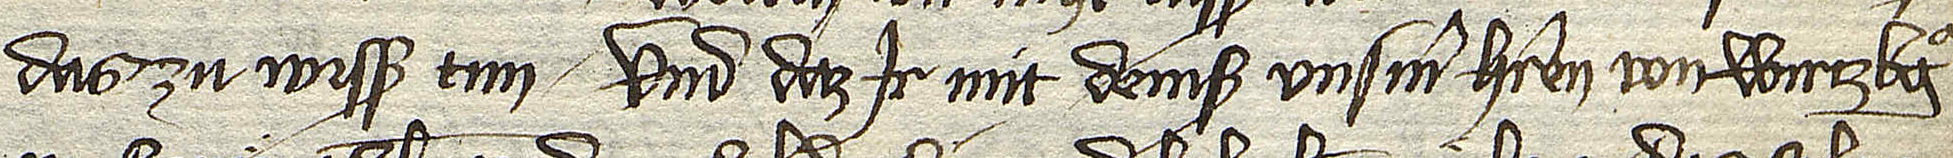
das ʒu wiſſ* tun / Vnd daʒ Ir mit demſ* vnſm* h*ren von Wircʒb*g
